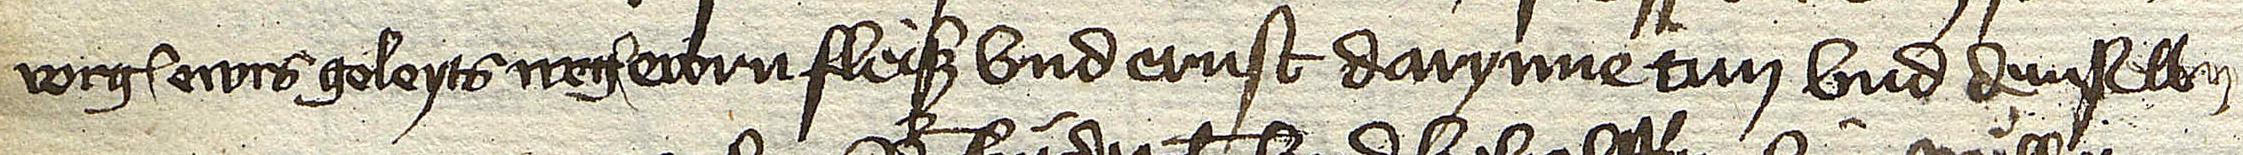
vorg* ewrs geleyts weg* ewrn fleiſʒ vnd ernſt darynne tun vnd demſelbn*
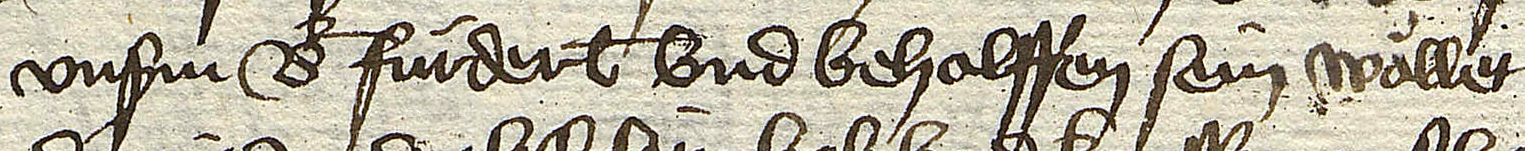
vnſ*m B* fürderl* vnd beholffen ſein wöllet
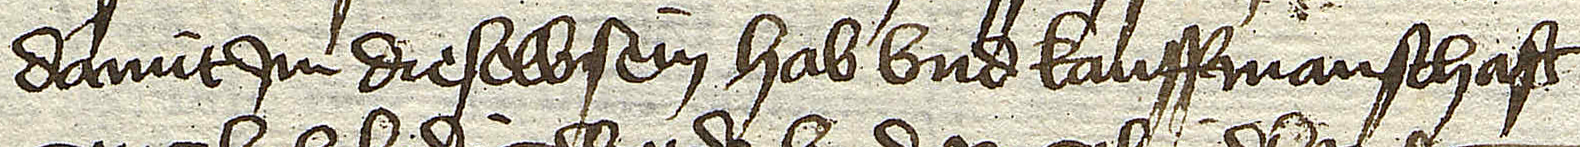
damit Im dieſelb ſein hab vnd kauffmanſchaft
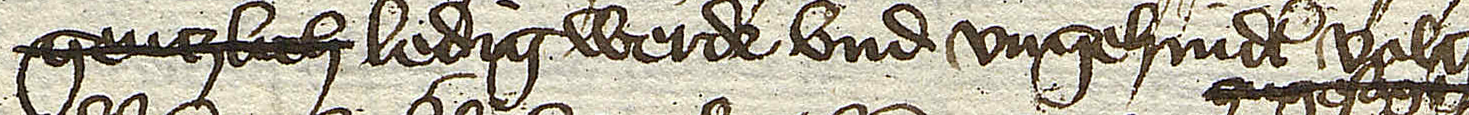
gencʒlich ledig werde vnd vngehind*t volg
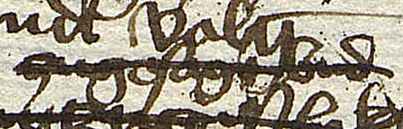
cʒugeſagt vnd
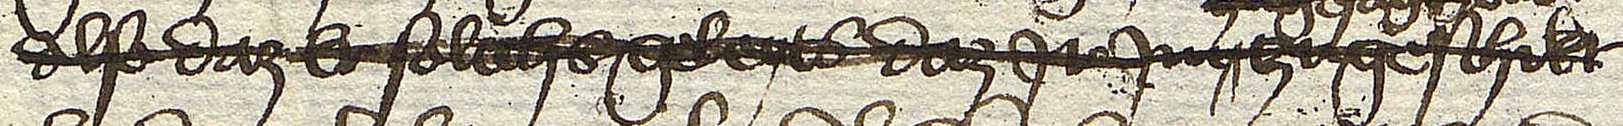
Alſo daʒ Er ſölichs geleyts daʒ Ir Im cʒugeſchikt
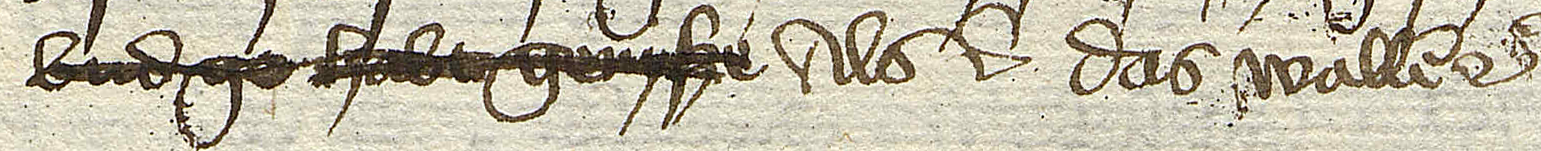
vnd ge habt genyſʒe Als ec* das wölle* ec*
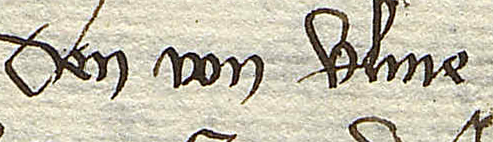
Den von Vlme
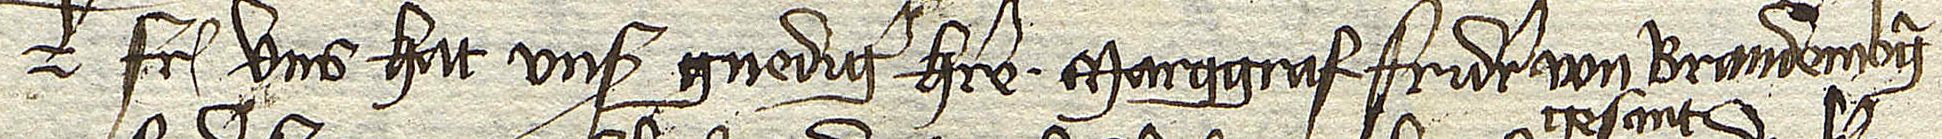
L* fr* Vns hat vnſ* gnedig* h*re . Marggraf Fridr* von Brandemb*g
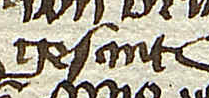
geſant
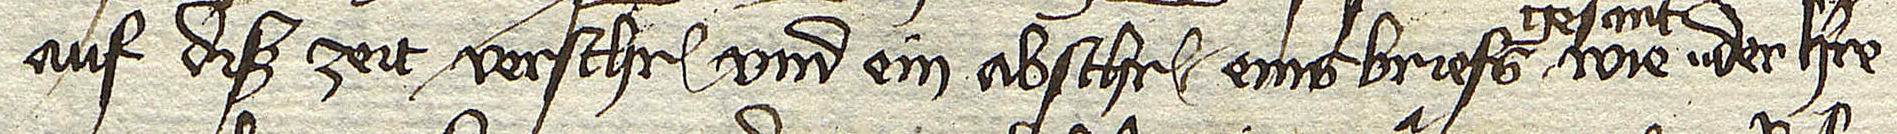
auf diſʒ ʒeit verſchr* vnd ein abſchr* / eins briefs wie ~ die h*re
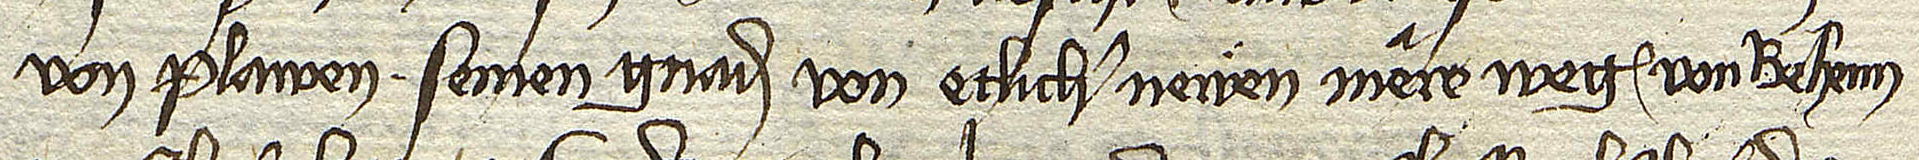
von Plawen . ſeinen gand* von etlich* newen mëre weg* von Beheim
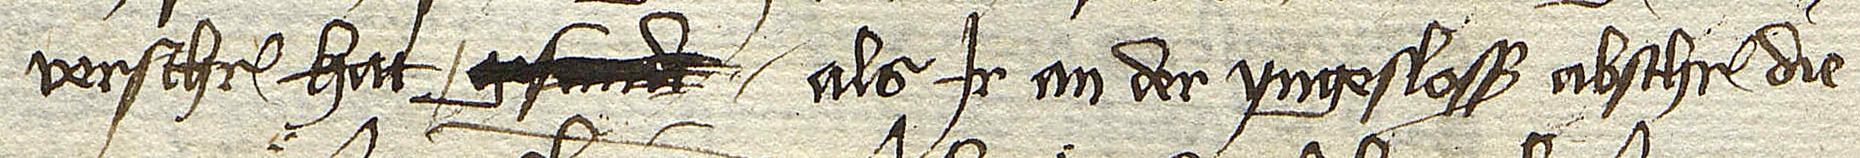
verſchr* hat / geſandt / als Ir an der yngeſloſſ* abſchr* die
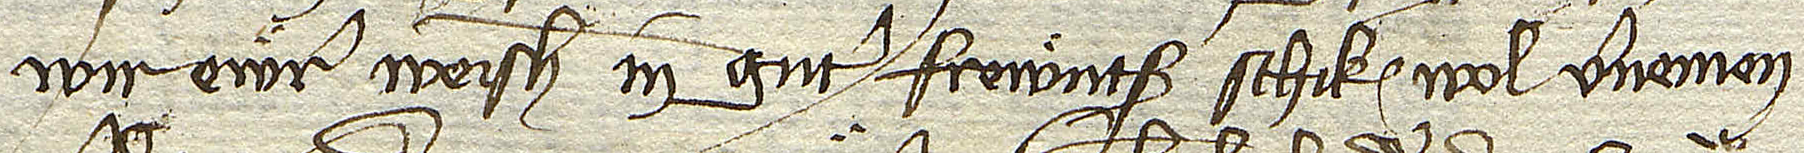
wir ew*r weiſh* in gut* frewntſ* ſchik* wol v*nemen
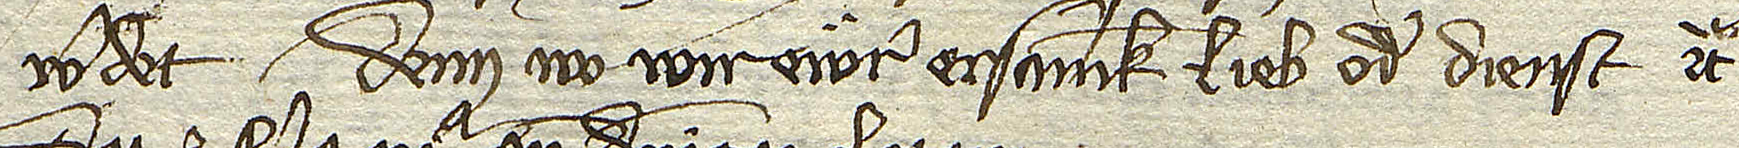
w*det / Denn wo wir ew*r erſamk* lieb od* dienſt ec*
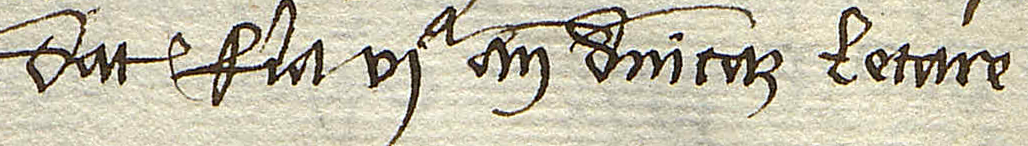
Dat* fia* vi* an* dnica* Letare
